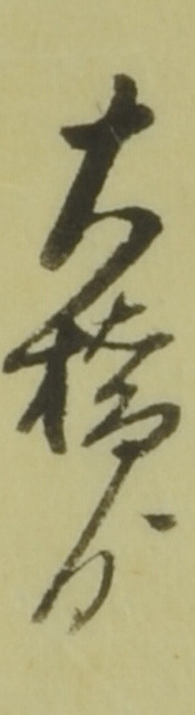大橋ゟ
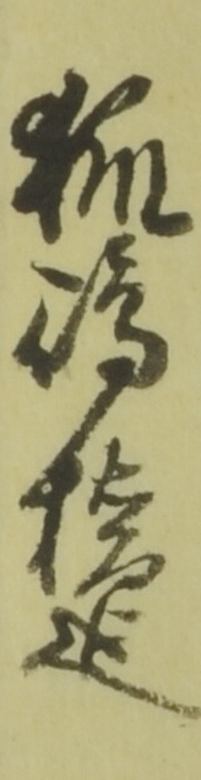狐嶋橋迄

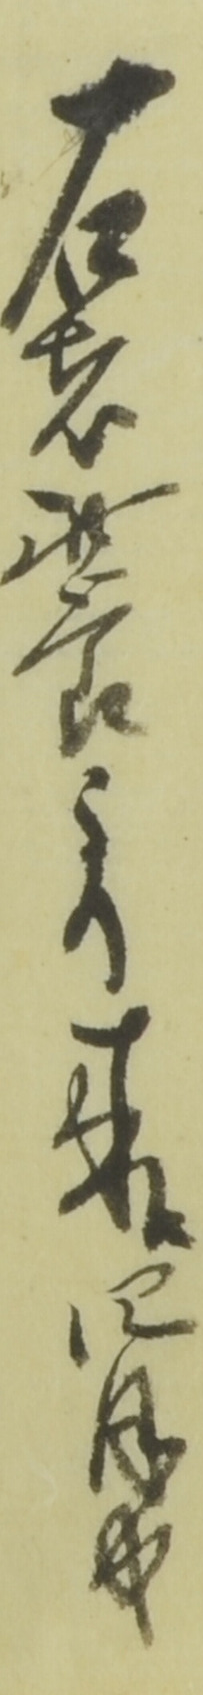右は此節より来ル四月中
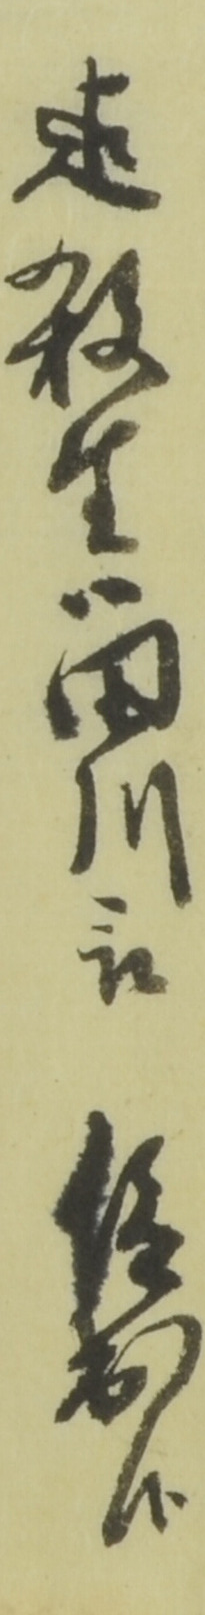迄殺生ハ田川被仰出候
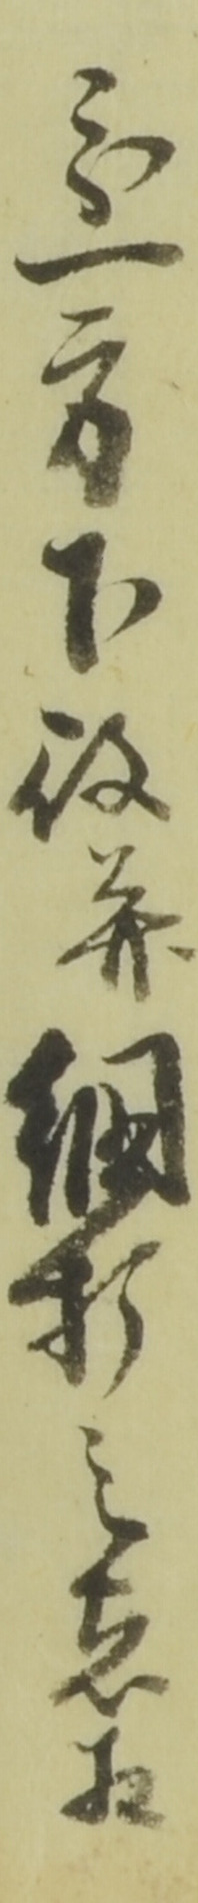分一方下役并網打之者相
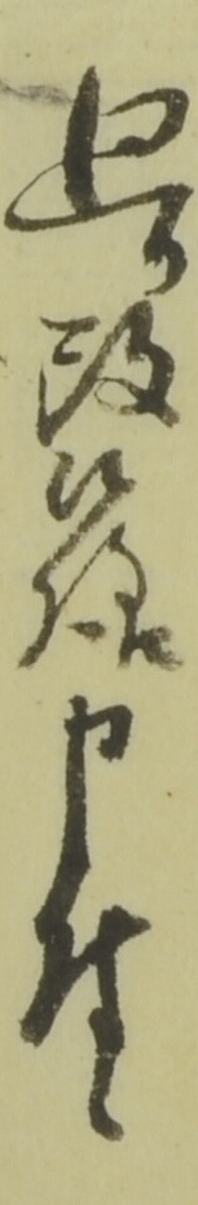廻り改候様申付候
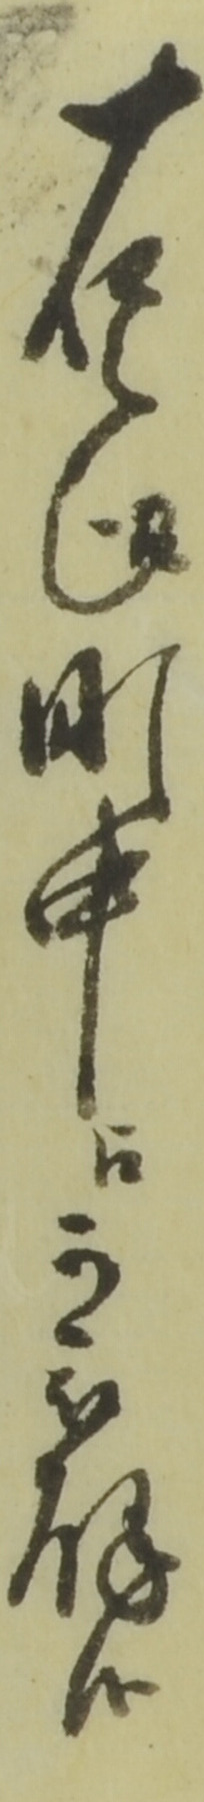右之趣町中江可被触候
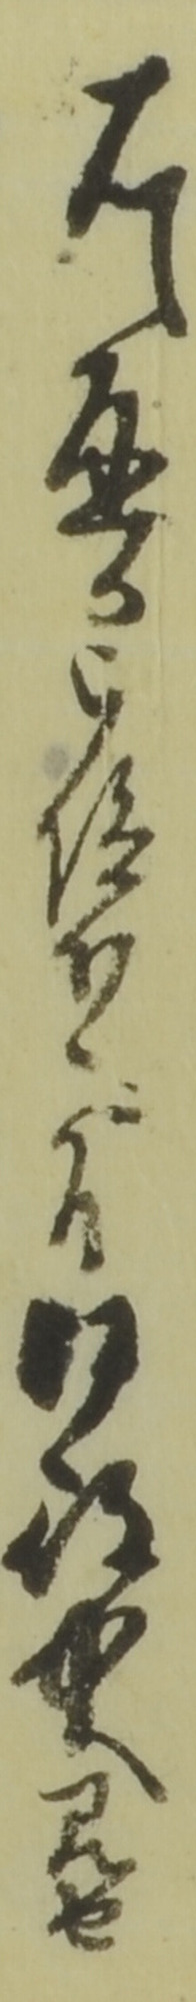右之通り被仰下候ニ付御役中へ見セ
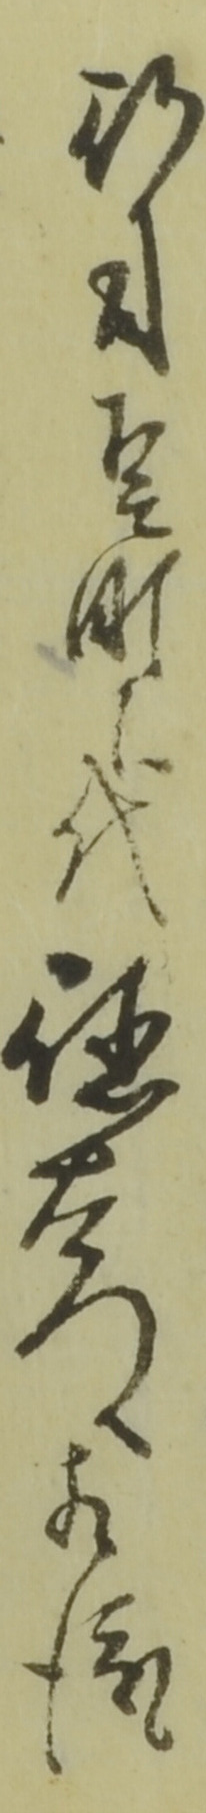行司町丁代徳右衛門へ相渡候
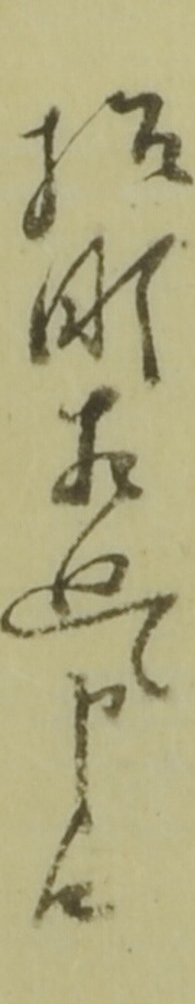町相廻シ申候
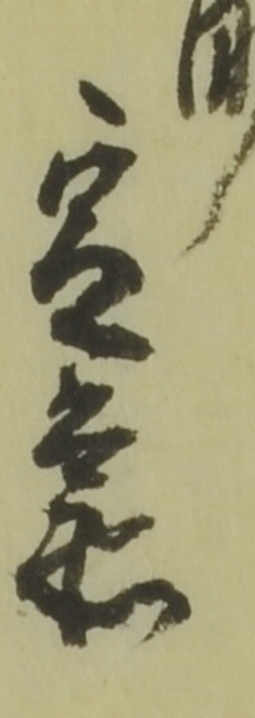定兵衛
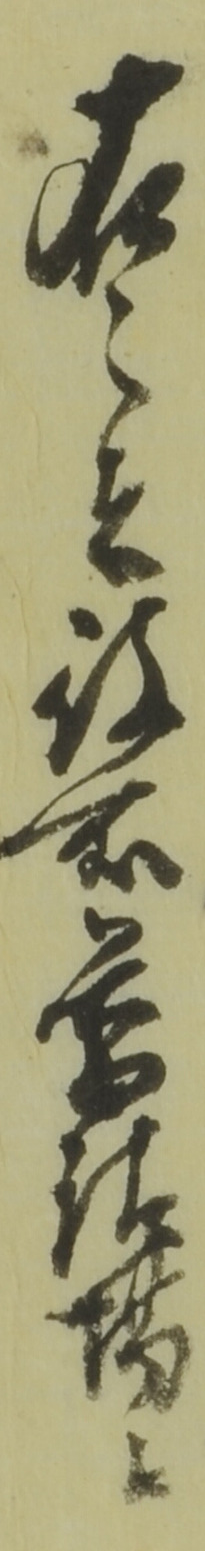右之者役所普請場江
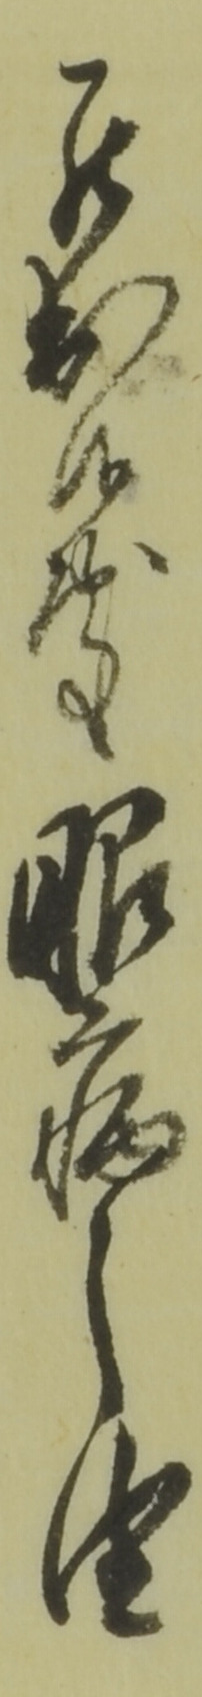罷出候処眼病之由
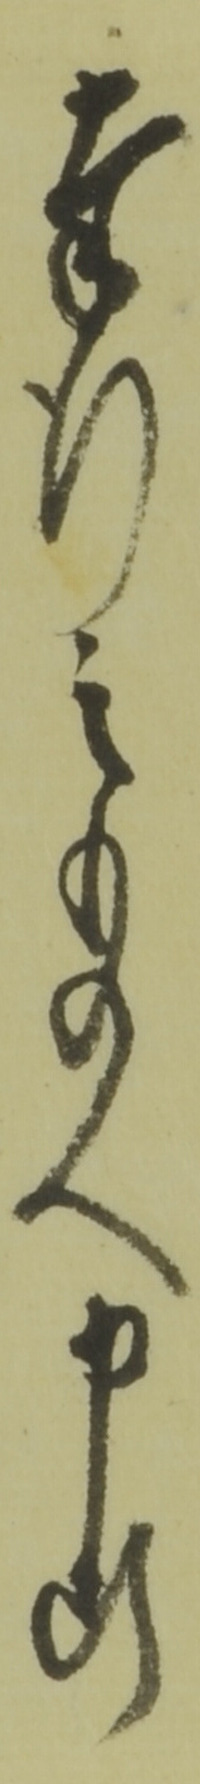奉行之ものへ申断り
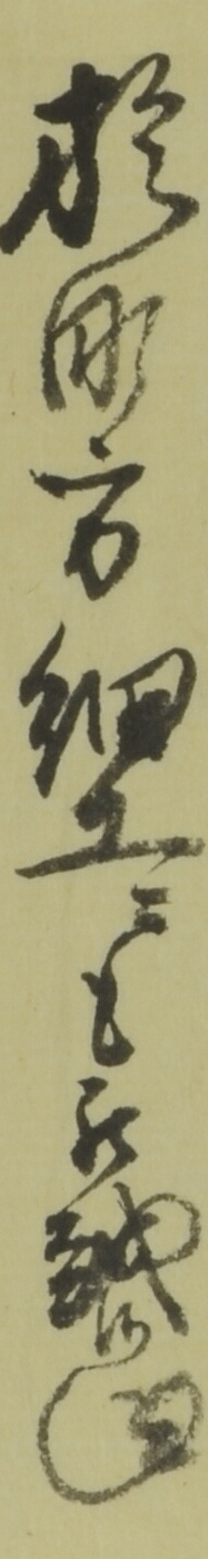於町方細工ニも罷越候趣
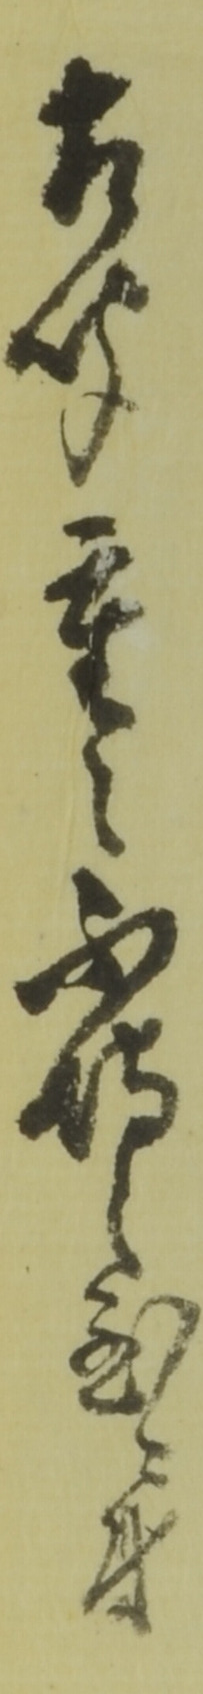相聞重々不埒之至ニ付
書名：御触書御書附控
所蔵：伊那市立高遠町図書館・合同会社AMANE
